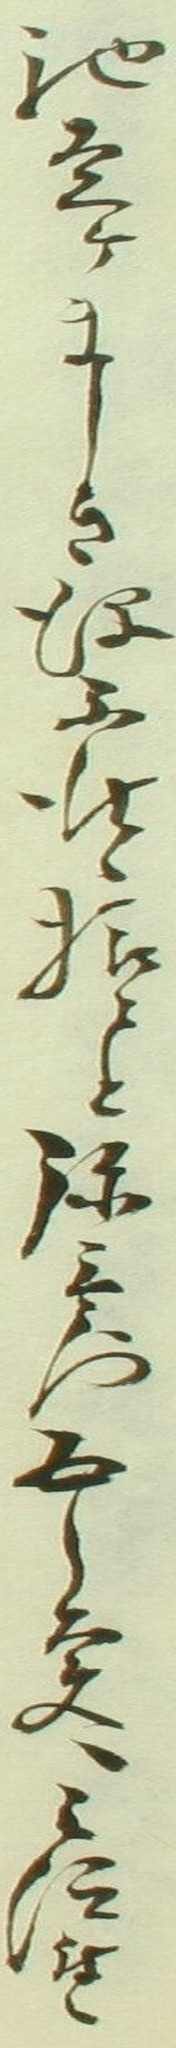馳走ヶましき儀不仕候様ニと弥三右衛門五郎大夫へ被仰付候
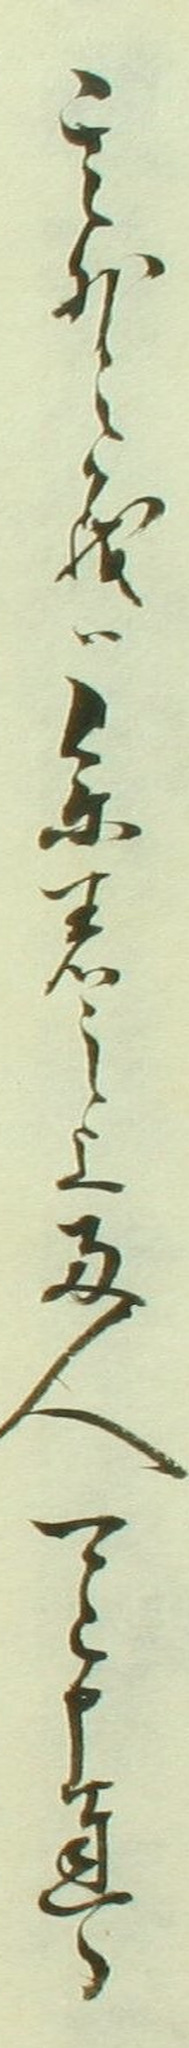其外之義ハ参着之上両人可被申達候
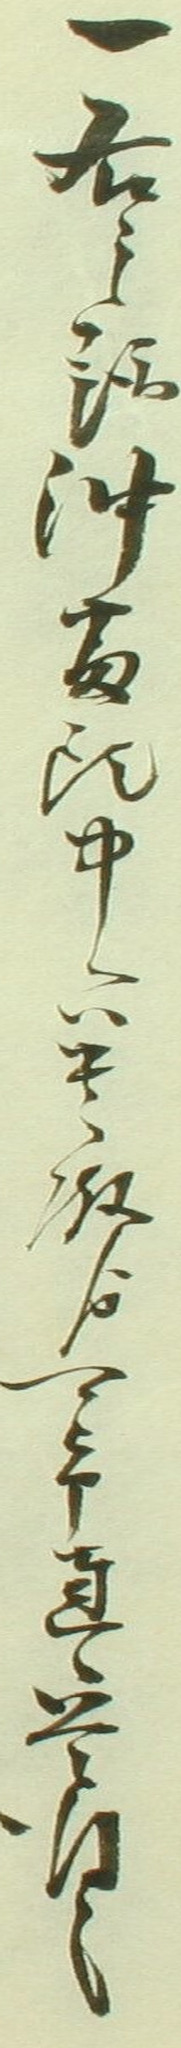一右之趣沖番頭中へハ貴殿ゟ可被申達候恐々謹言
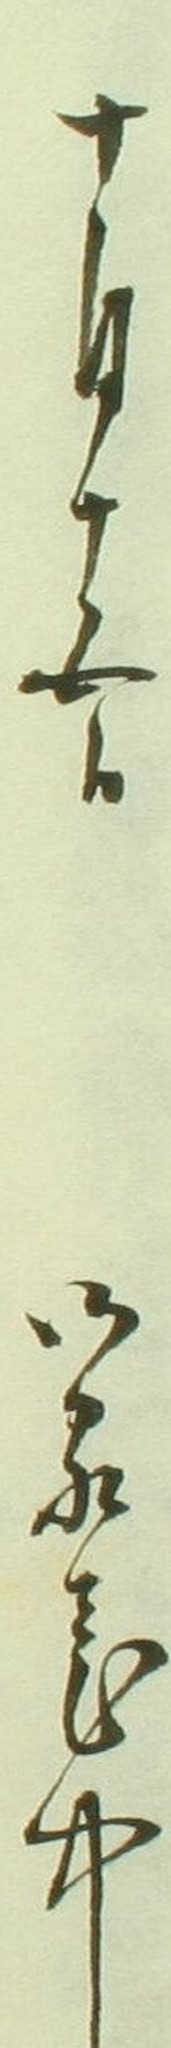十月十五日御家老中
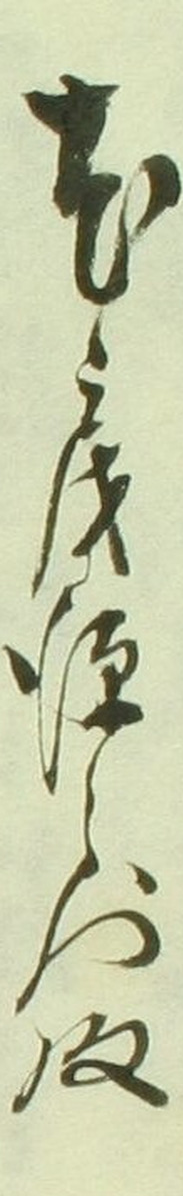花房源右衛門殿
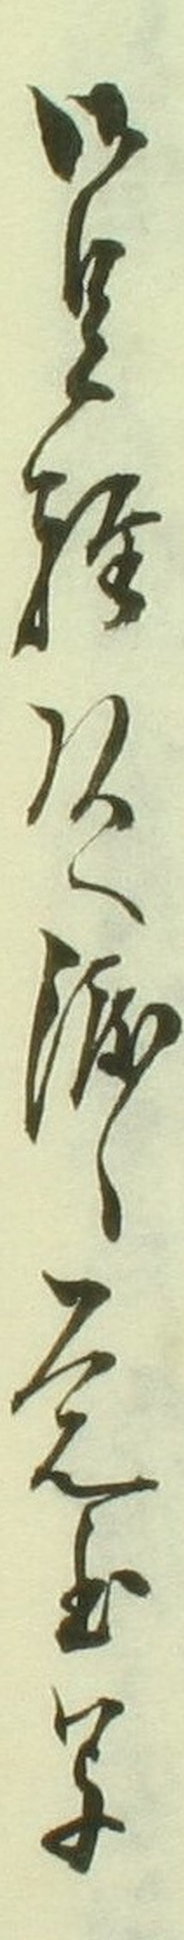御足軽頭へ渡候覚書写
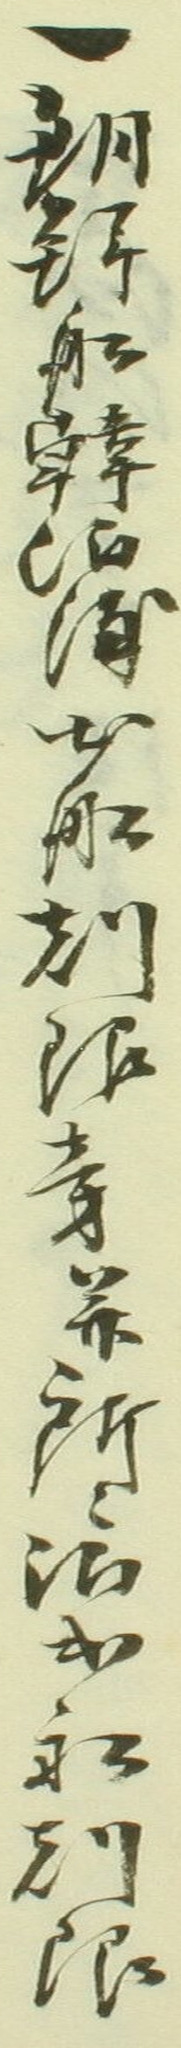一朝鮮船韓泊浦出船刻限旁并所々泊出船刻限
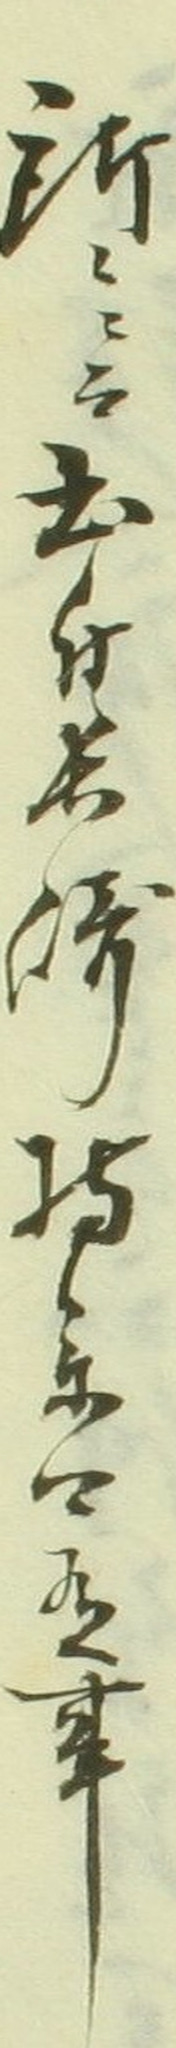所々ニ而書付長崎持参可有事
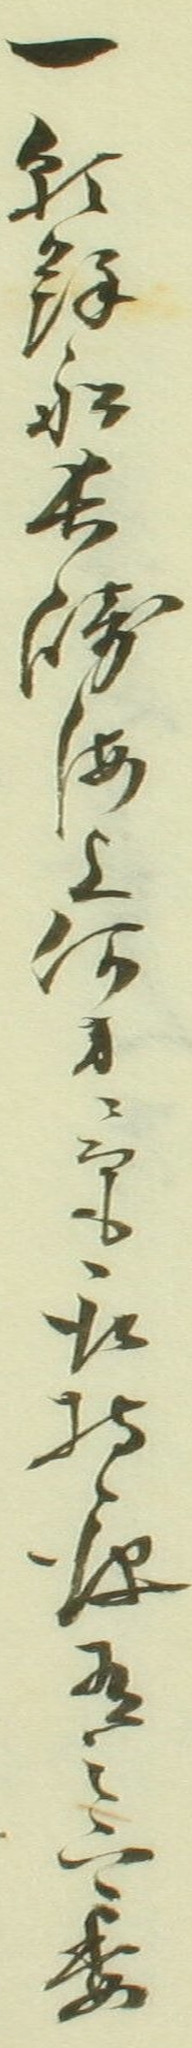一朝鮮船長崎海上何方ニ而も取持候儀有之候ハヽ委
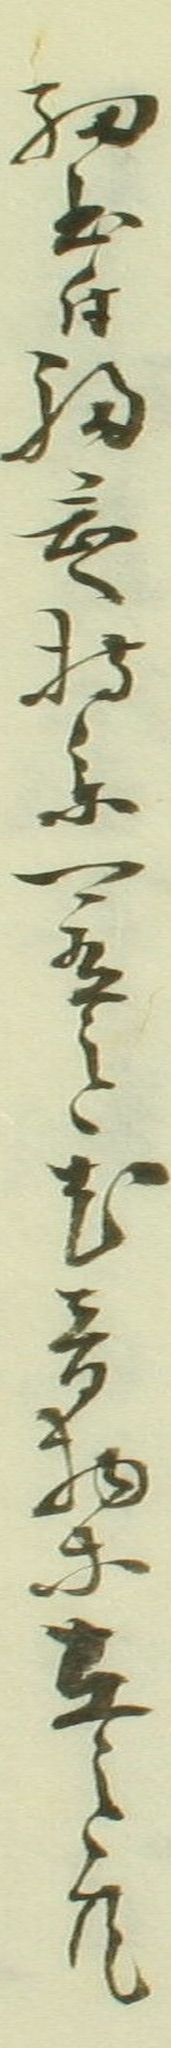細書付福岡ヘ持参可有之候尤音物等在之候共
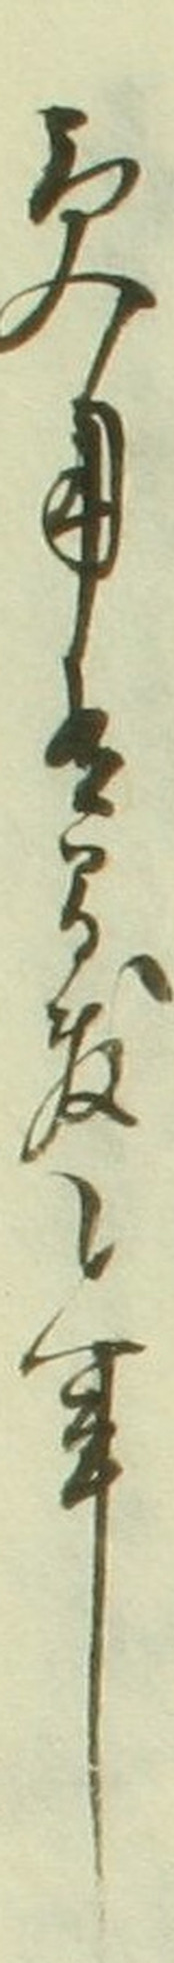受用有間敷候事
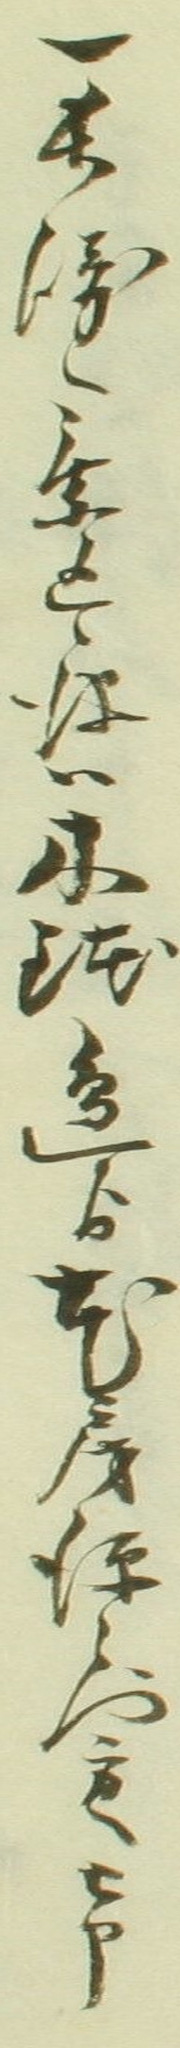一長崎へ乗込候儀ハ木鉢辺ゟ花房源右衛門方へ被申
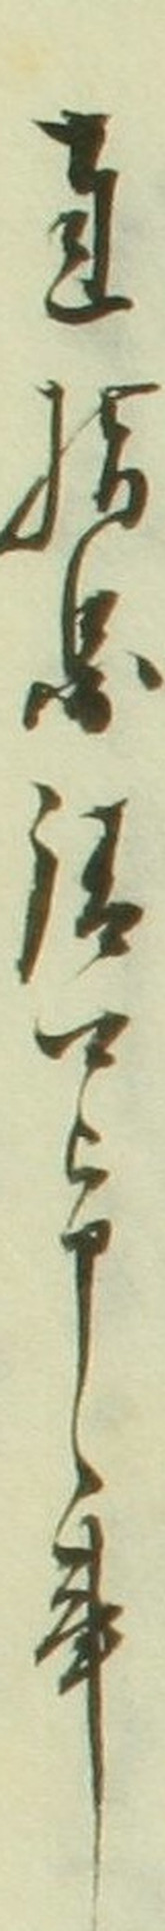達指図請可被申候事
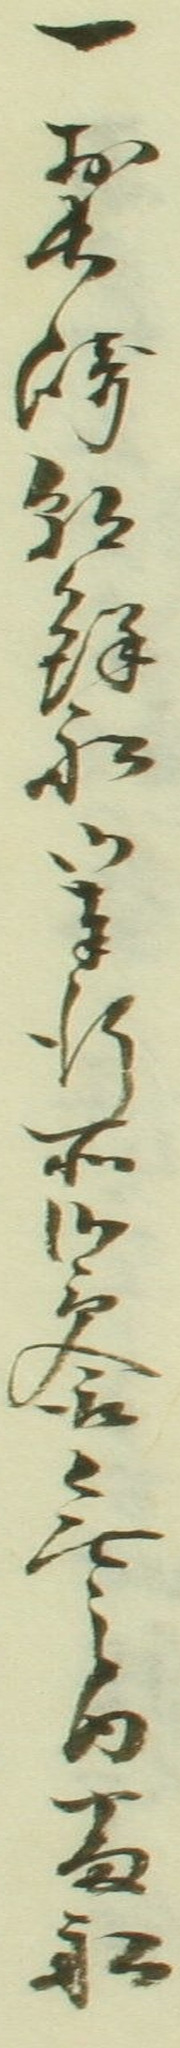一於長崎朝鮮船御奉行所御受取無之内番船
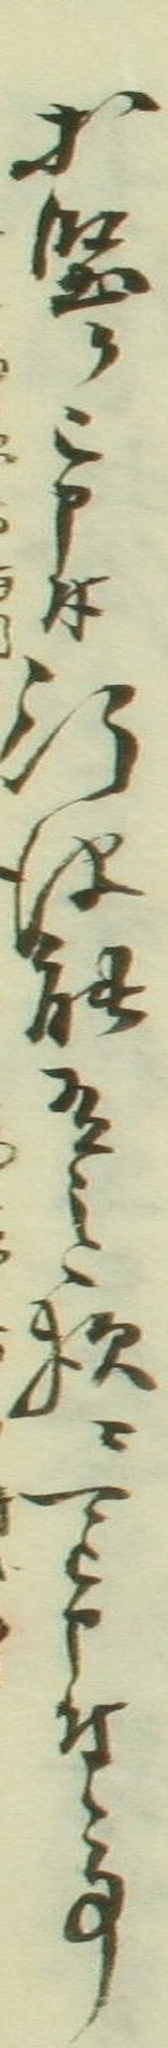等堅ク被申付行儀能有之候様ニ可被申付候事
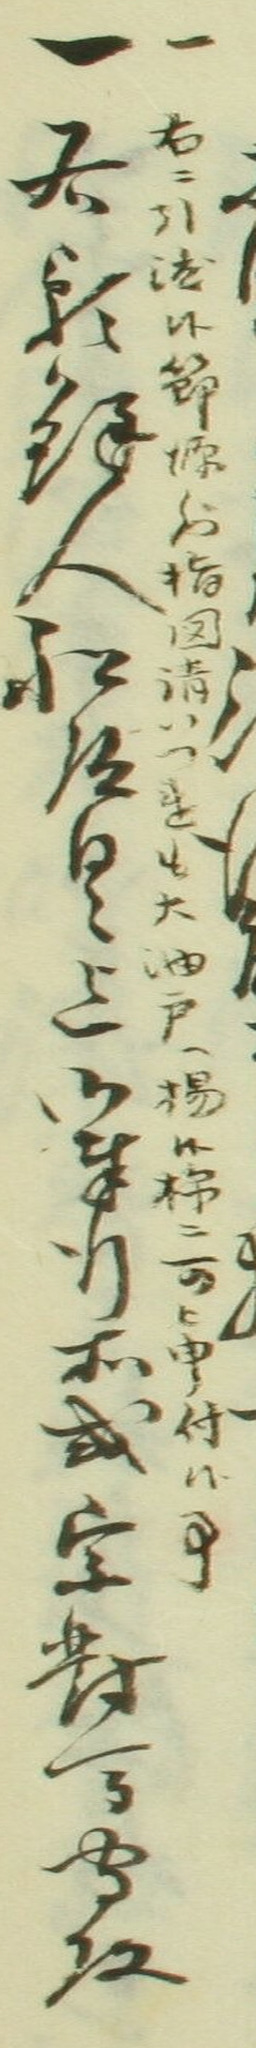一右朝鮮人船道具迄御奉行所或宗対馬守殿
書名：異国船漂着記
